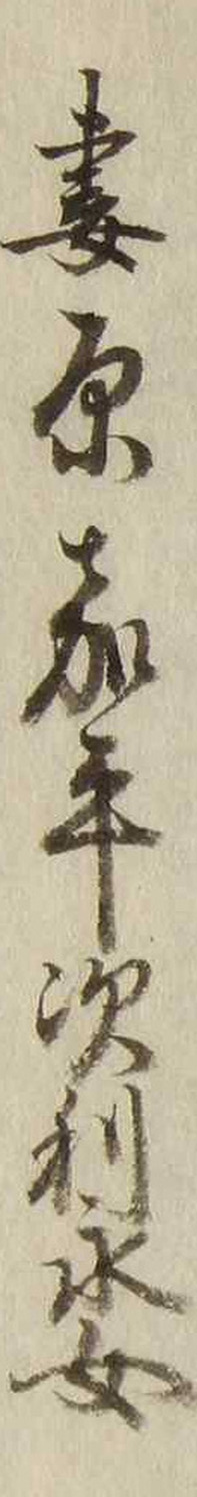妻原嘉平次利永女

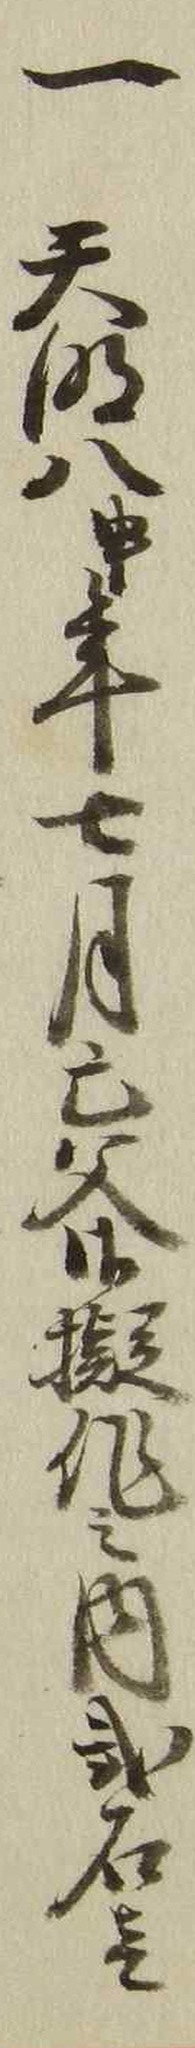一天明八申年七月亡父御擬作之内弐石壱
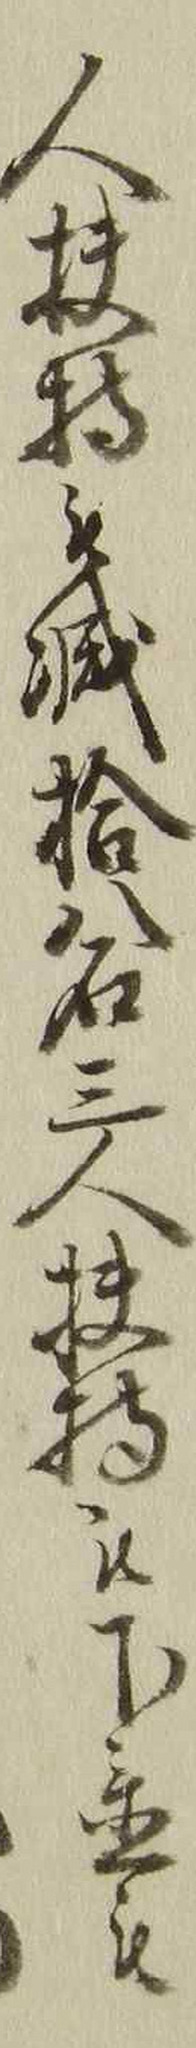人扶持被減拾八石三人扶持被下置被
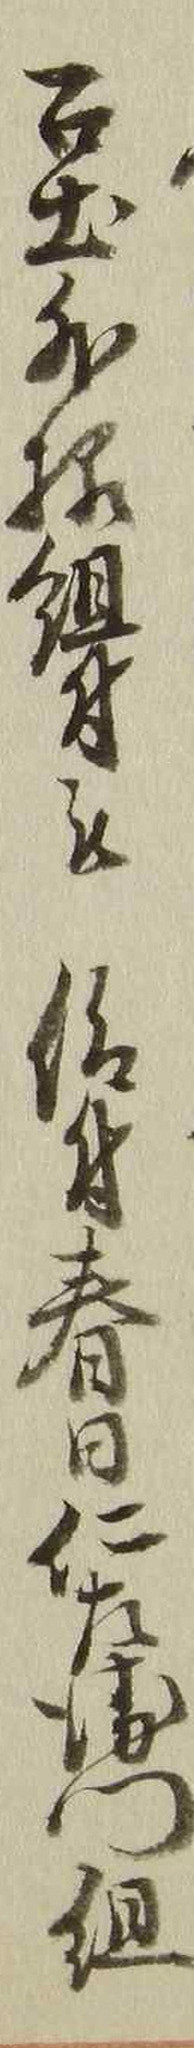召出外様組付被仰付春日仁左衛門組
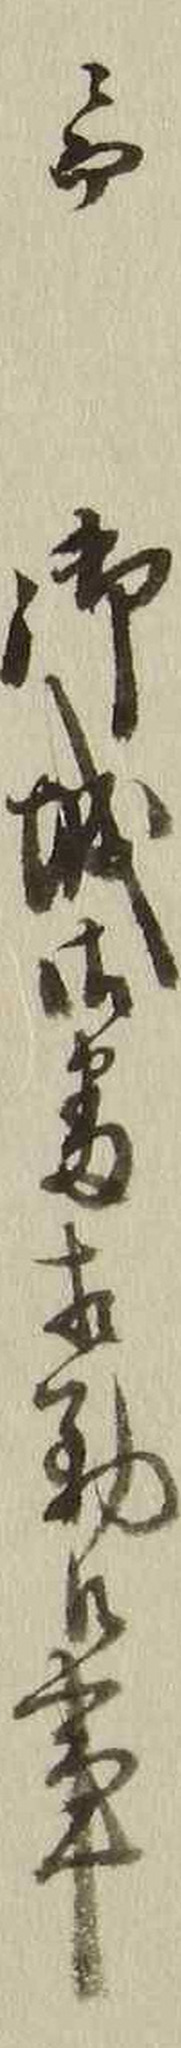ニ而御城御番相勤候事
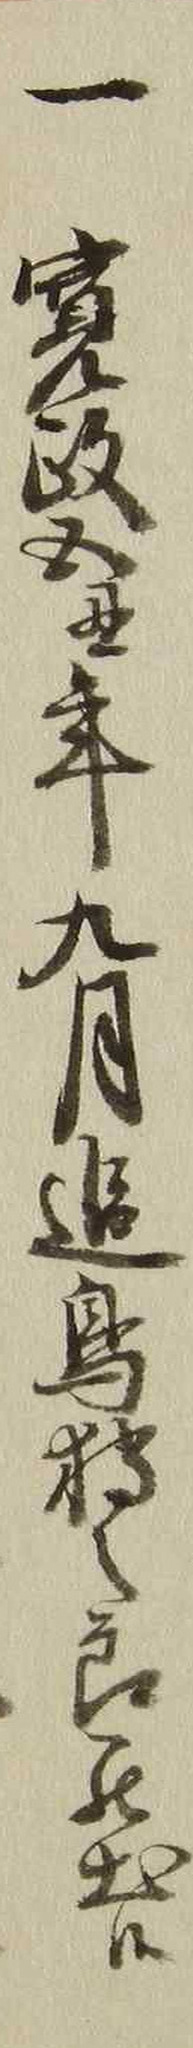一寛政五丑年九月追鳥狩之節罷出候
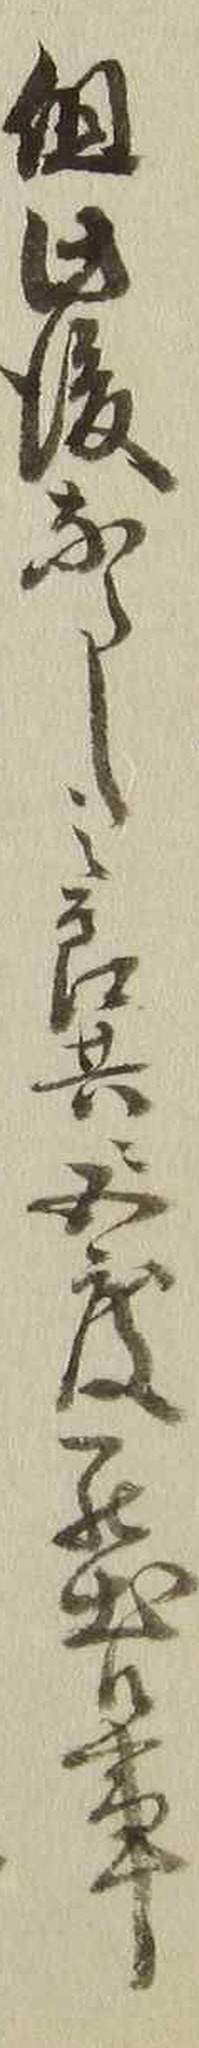但此後ならし之節共ニ五度罷出候事
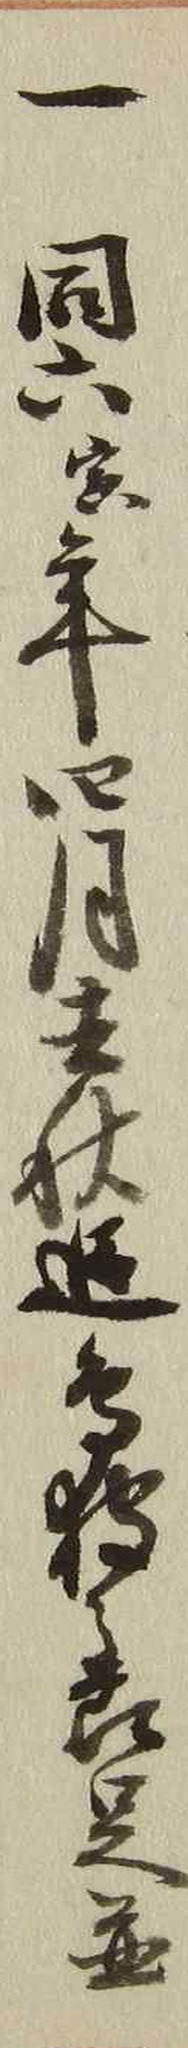一同六寅年四月去秋追鳥狩之節足並
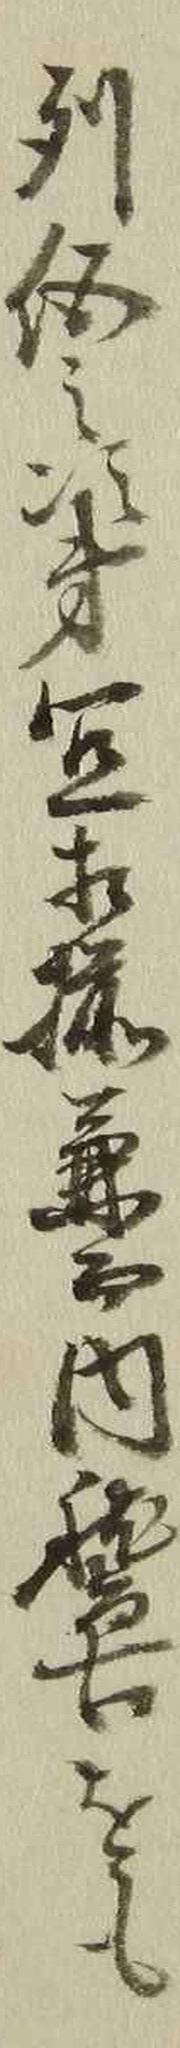列伍之次第宜相揃兼而内稽古をも
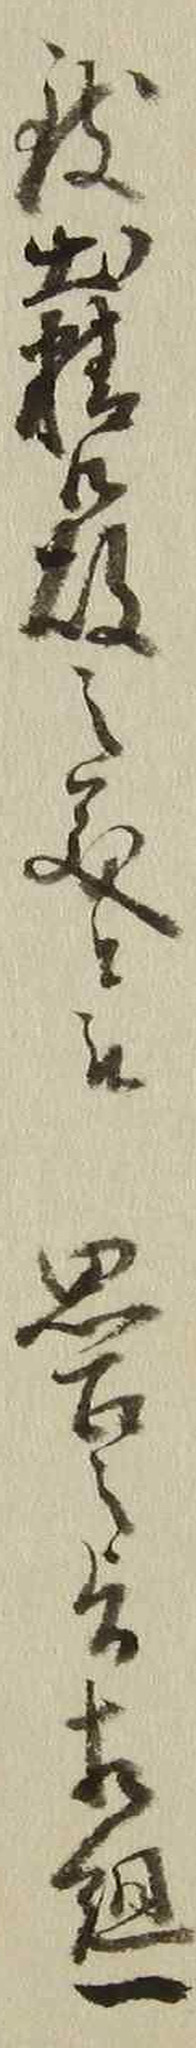致出精候故之義ニ被思召之旨相組一
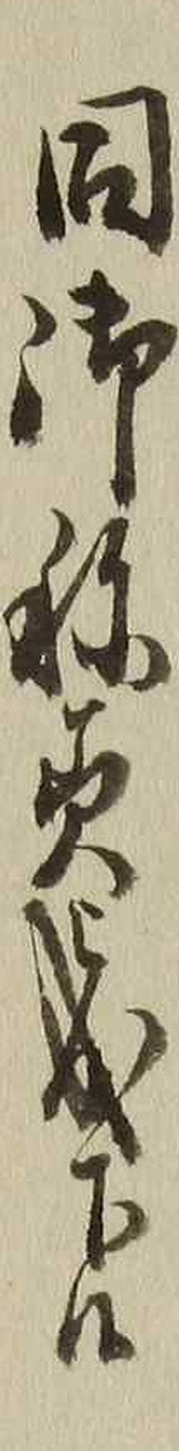同御称美被成下候
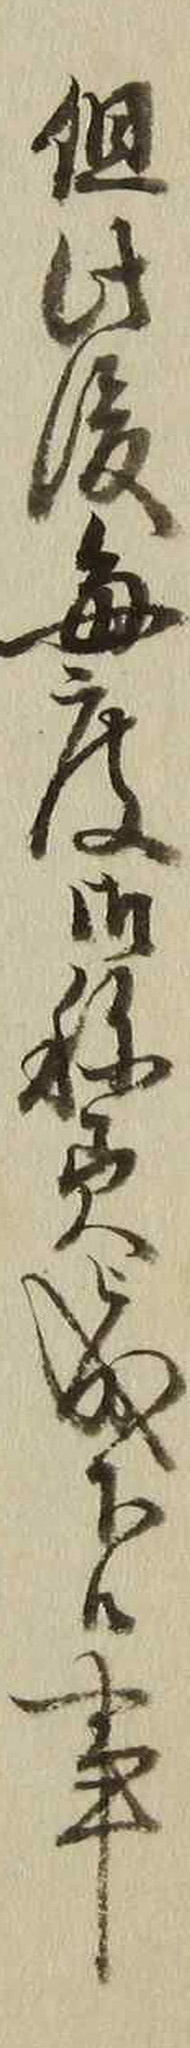但此後毎度御称美被成下候事
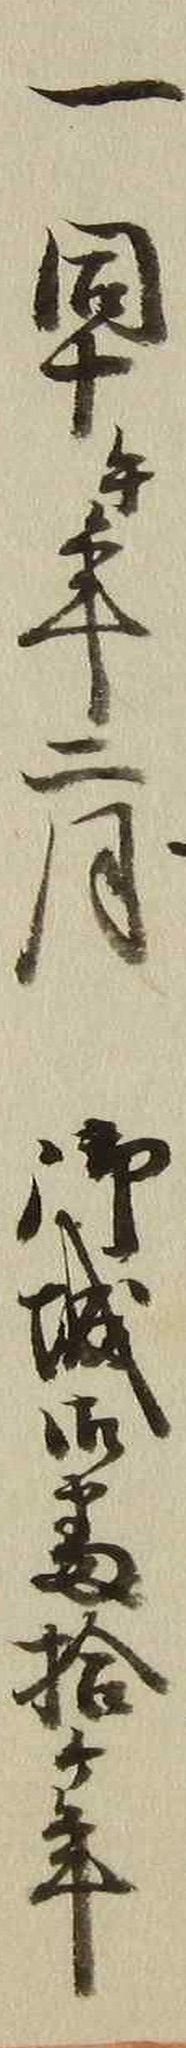一同十午年二月御城御番拾ヶ年
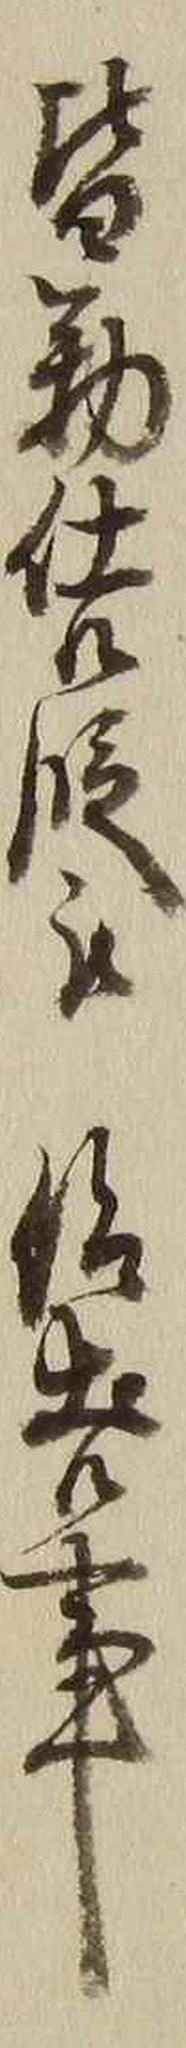皆勤仕候段被仰出候事
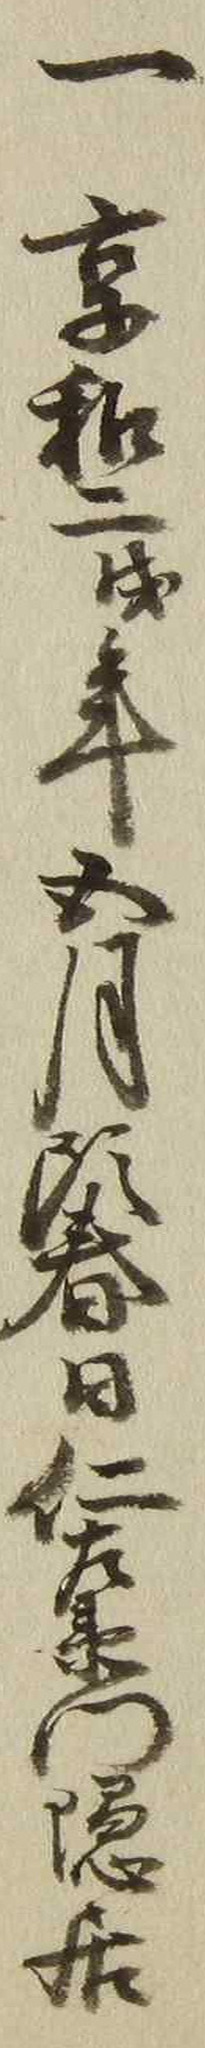一享和二戌年五月頭春日仁左衛門隠居
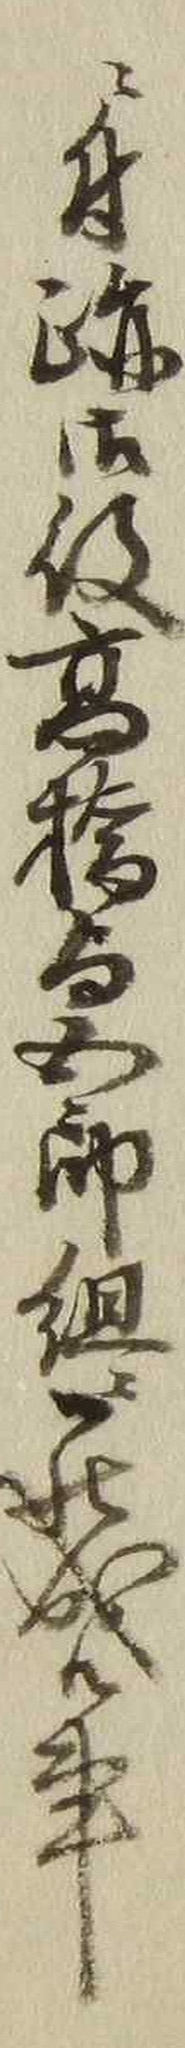ニ付跡御役高橋与五郎組ニ罷成候事
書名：諸士系譜　巻之53　に之部4
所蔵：会津若松市立会津図書館
